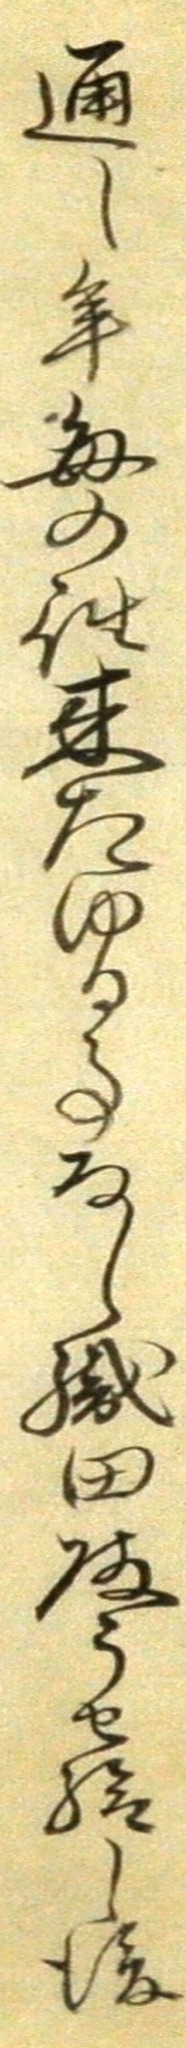通し年毎の往来たゆる事なし織田殿うせ給し後
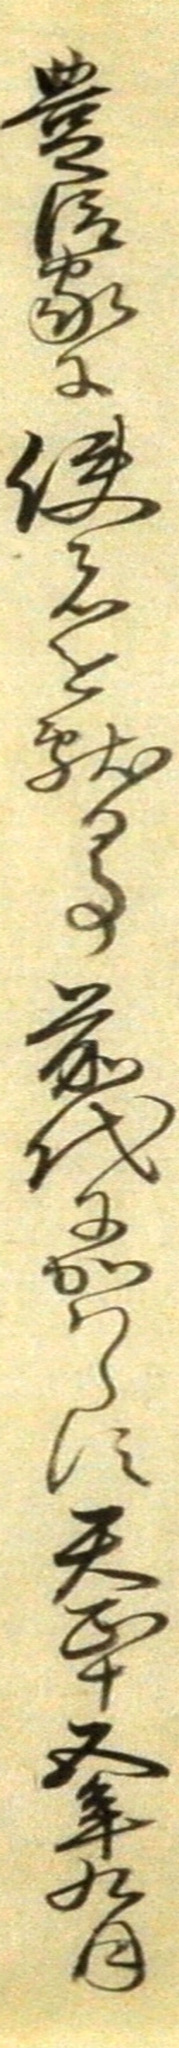豊臣家に使者を献る事前代にかはらす天正十五年九月
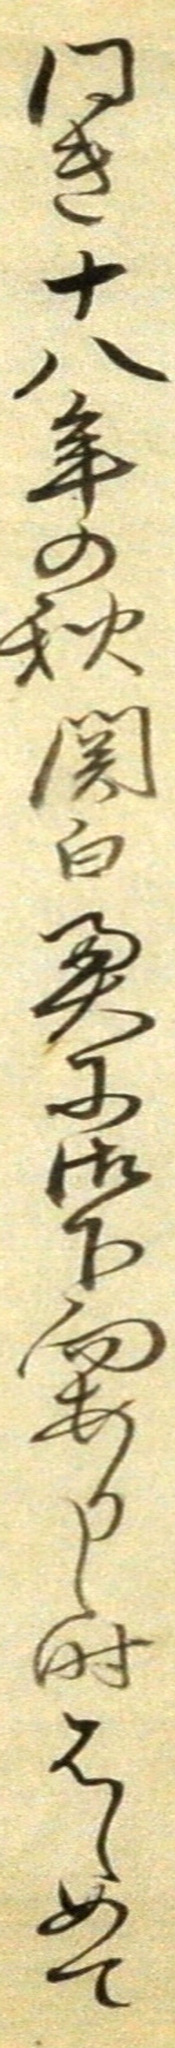同き十八年の秋関白奥に御下向ありし時はしめて
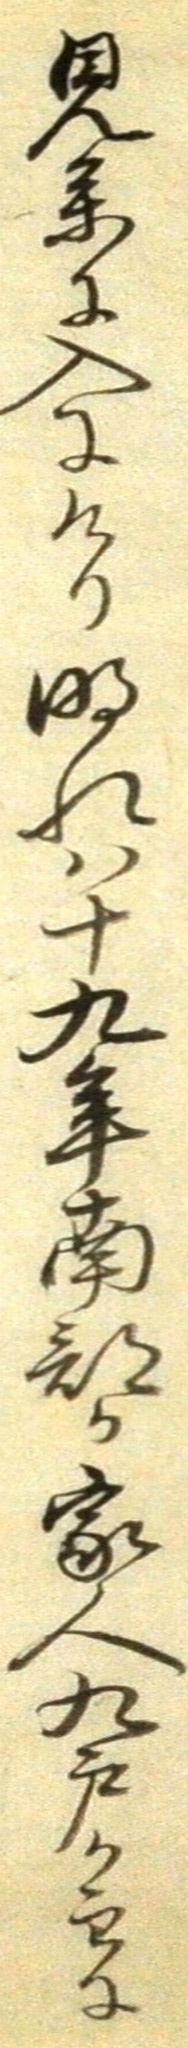見参に入にけり明れは十九年南部か家人九戸か主に
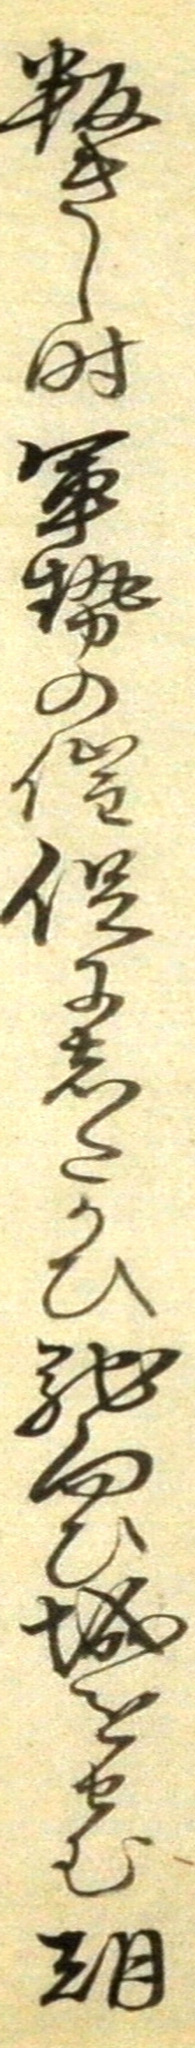叛きし時軍勢の催促にしたかひ馳向ひ城をせむ朝
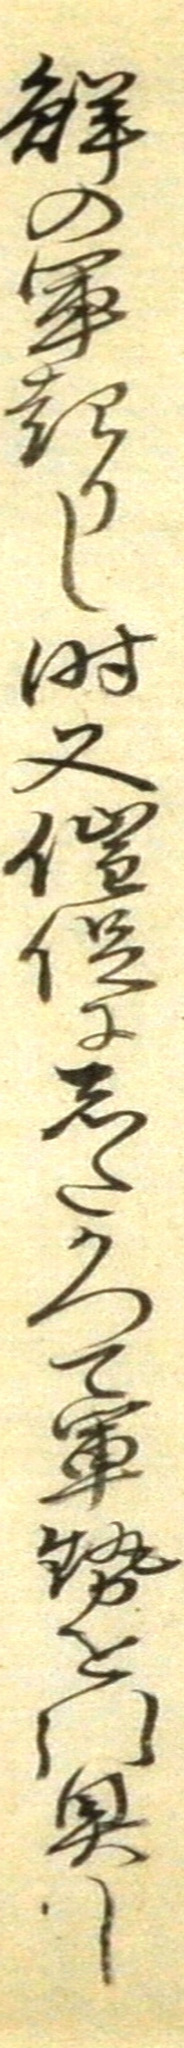鮮の軍起りし時又催促にしたかつて軍勢を引具し
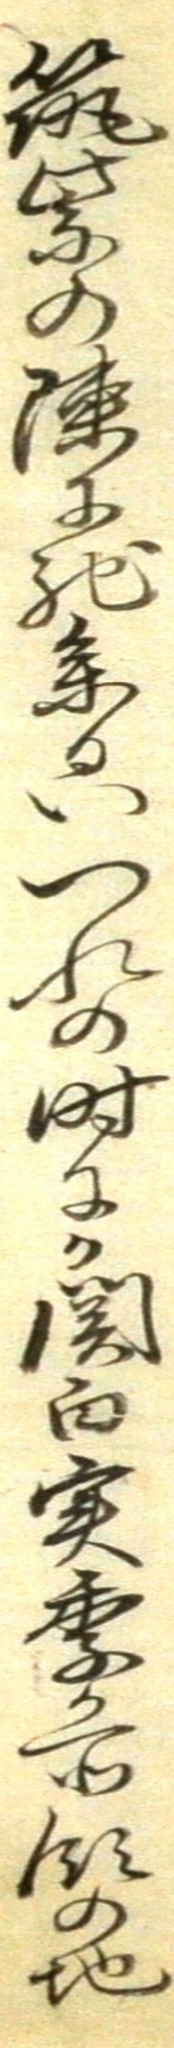筑紫の陣に馳参るいつれの時にか関白実季か所領の地
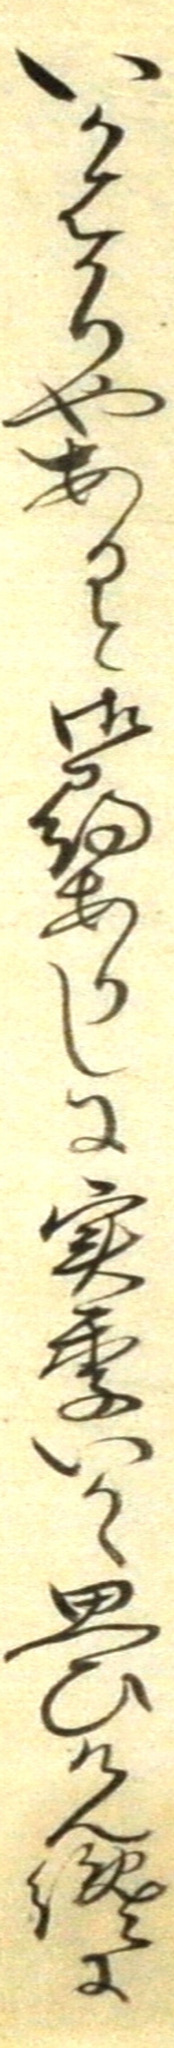いかはかりやあると御尋ありしに実季いかゝ思ひけん纔に
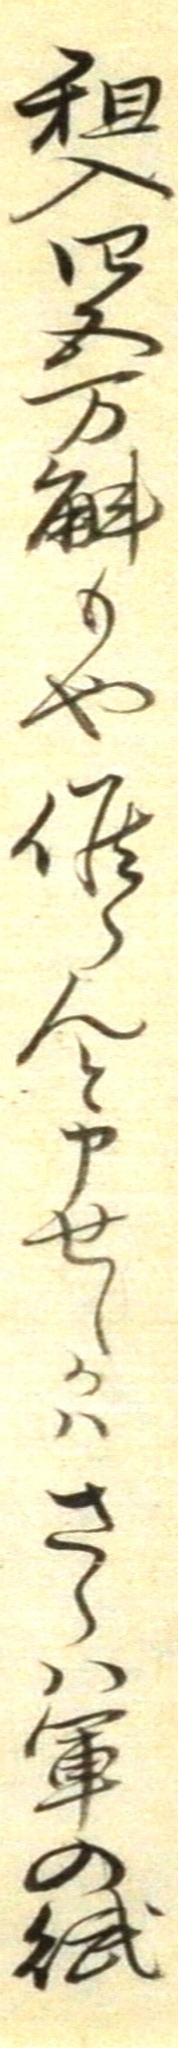租入四五万斛もや候らんと申せしかはさらは軍の賦
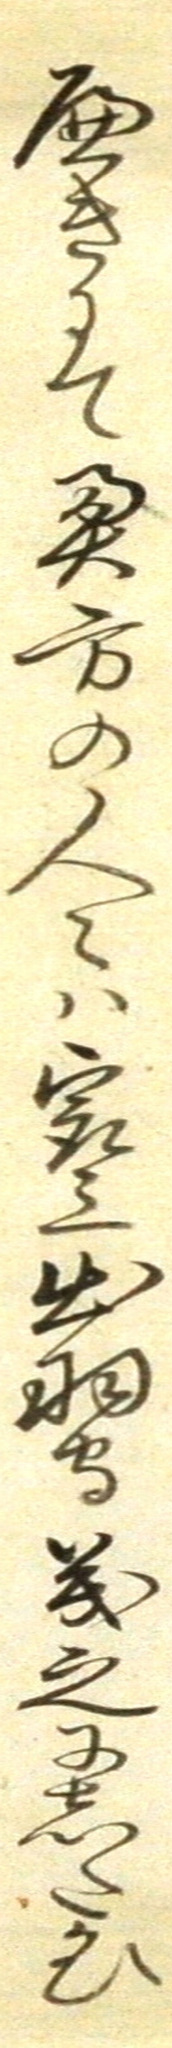へきにて奥方の人々は最上出羽守義之にしたかひ
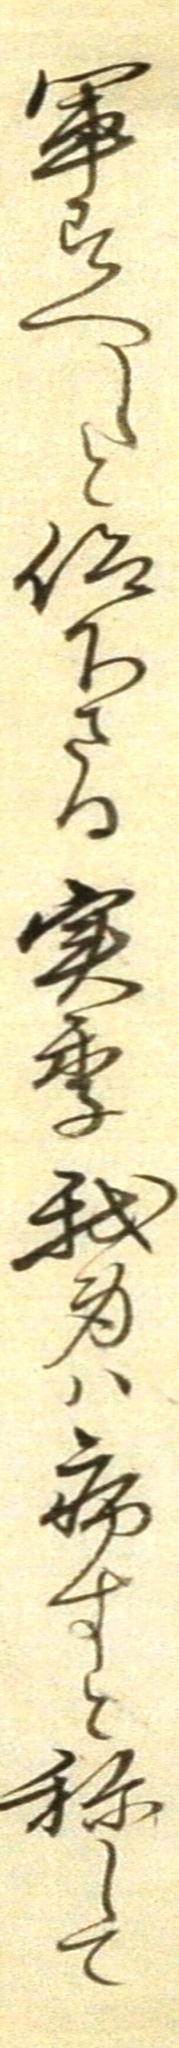軍すへしと仰下さる実季我身は病すと称して
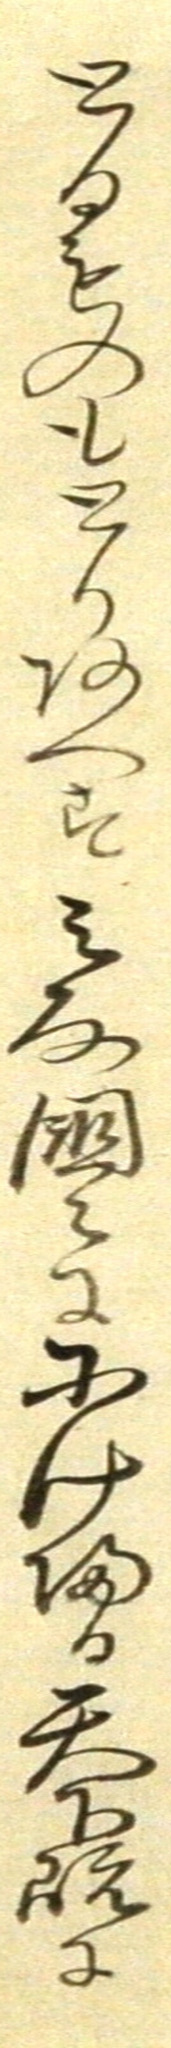とるものもとりあへすみな国々ににけ帰る天下既に
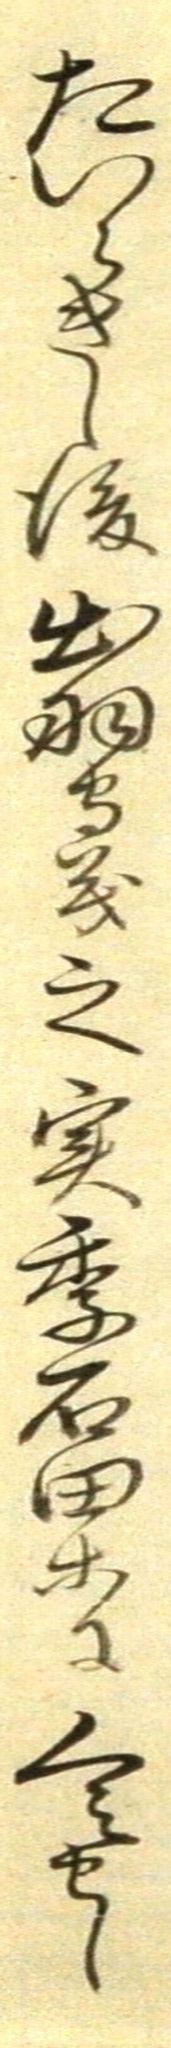たいらきし後出羽守義之実季石田等にくみせし
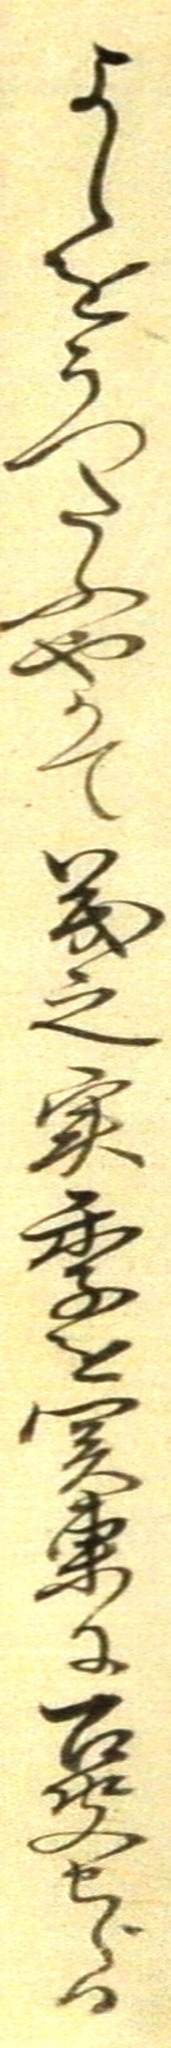よしをうつたふやかて義之実季を関東に召決せらる

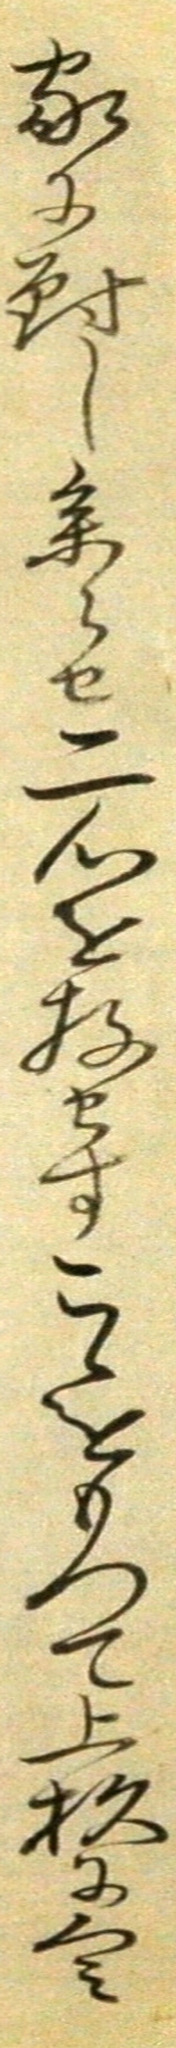家に対し参らせ二心を存せすこゝをもつて上杉にくみ
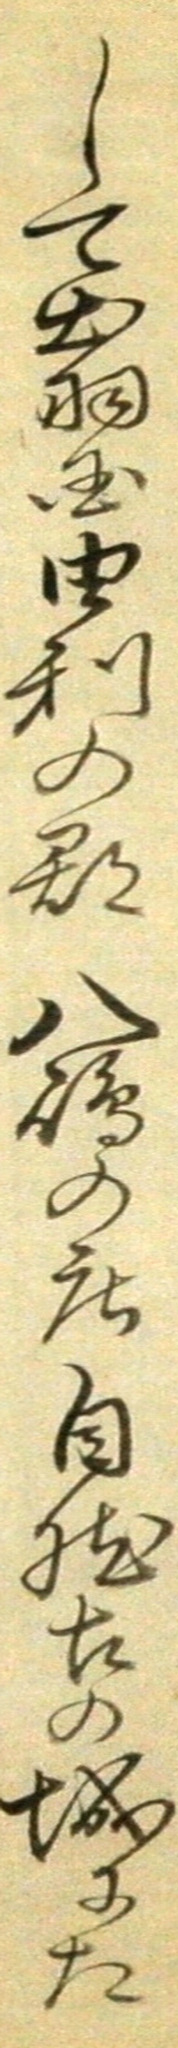して出羽国由利の郡八島の庄自然古の城にた
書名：藩翰譜（八・下）
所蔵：伊那市立高遠町図書館・合同会社AMANE
